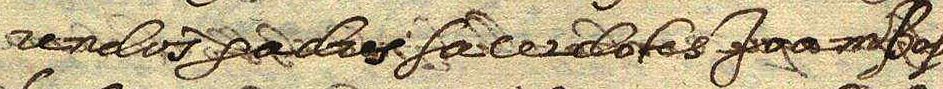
rendos padres Sacerdotes Joam Bap
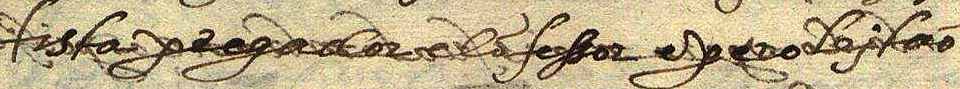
tista pregador e cõfessor e pero Leitaõ
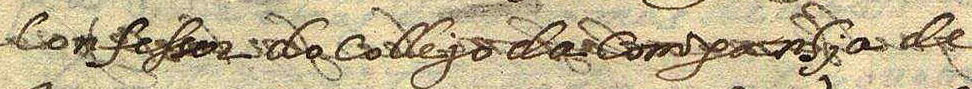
cõfessor do Collejo da Companhja de
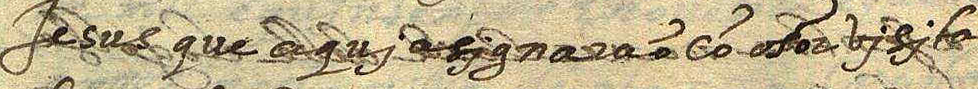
Jesus que aquj asignaraõ cõ o Sõr Vjsjta
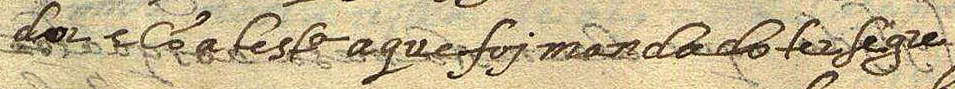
dor e cõ a test.a a que foj mandado ter segre
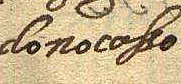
do no casso
